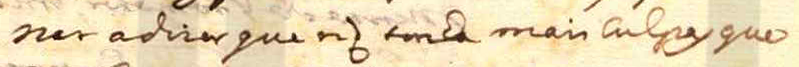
nar a dizer que nõ tinha mais culpas que
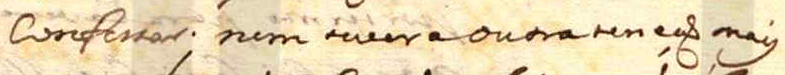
Confessar; nem tivera outra tençaõ mais
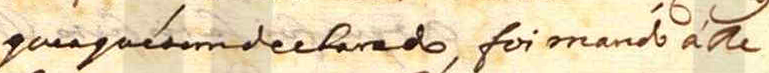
que o que tem declarado, foi mando á Re
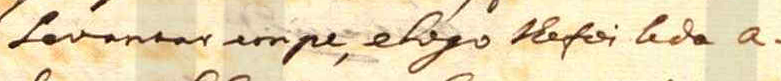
Levantar em pe, e logo lhe foi lida a
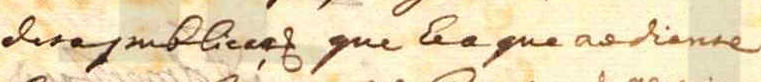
dita publicaçaõ que he a que aodiante
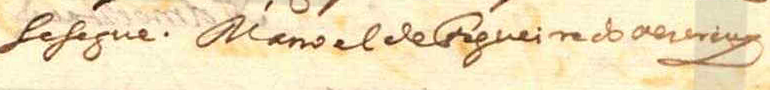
se segue. Manoel de Figueiredo o escreuy
